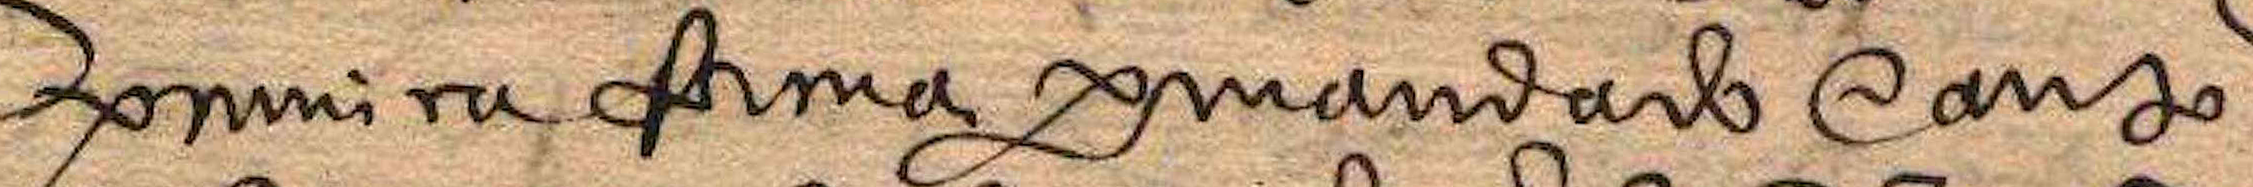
pruuica forma ꝑ mandado e auto
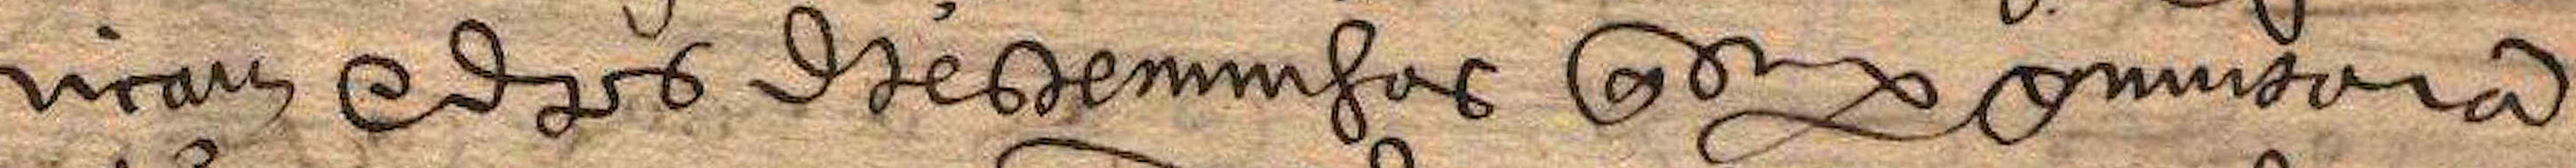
riçam e dtos dtestemunhas q̄ se ꝑgumtarā
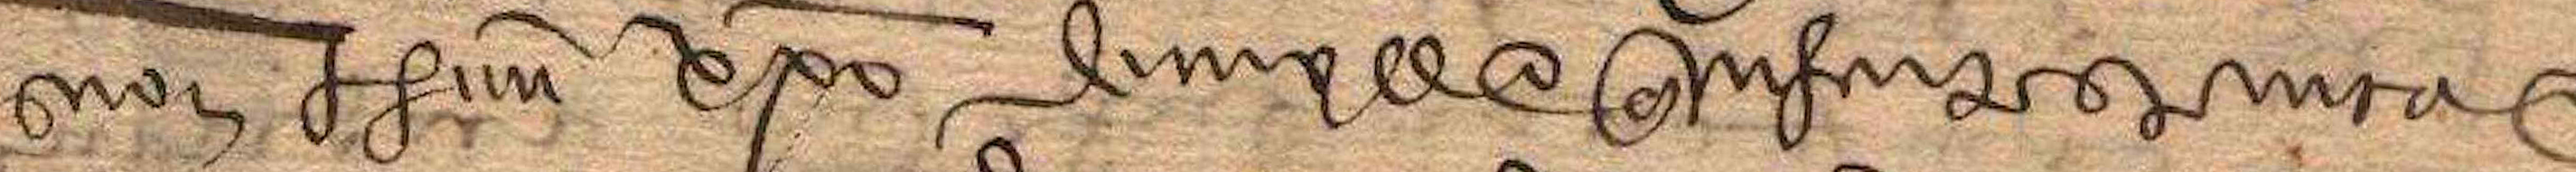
s̄nor Jhuū xp̄o de myll e q̄jnhentos trinta e
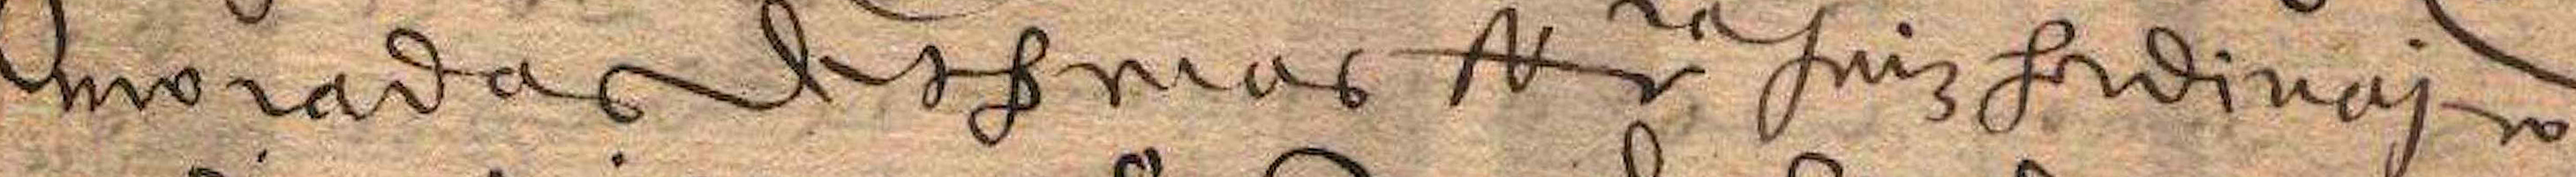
moradas de thomas ffrra Juiz hordinajro
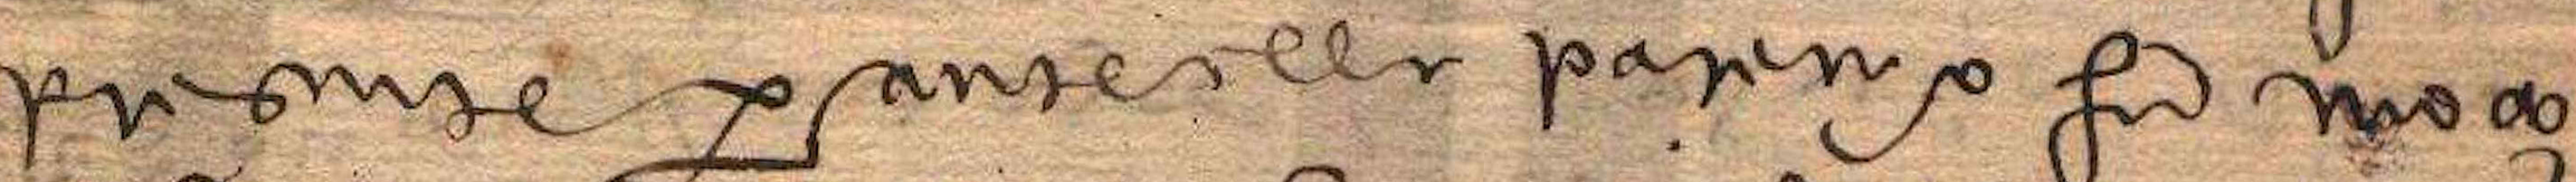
presente ꝑante elle pareçeo hū moço
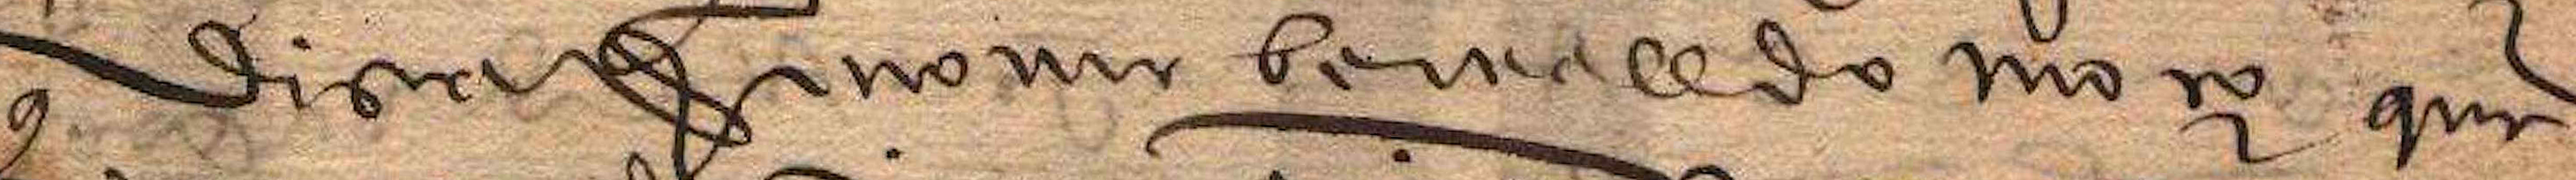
q̄ dise aꝟr nome bernalldo moço que
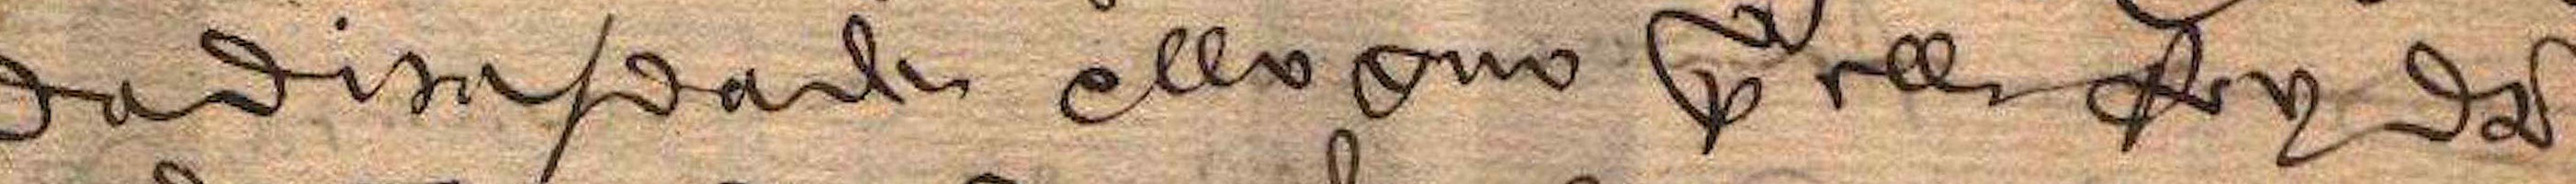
da dita Jdade e lloguo p̄o elle foy dto
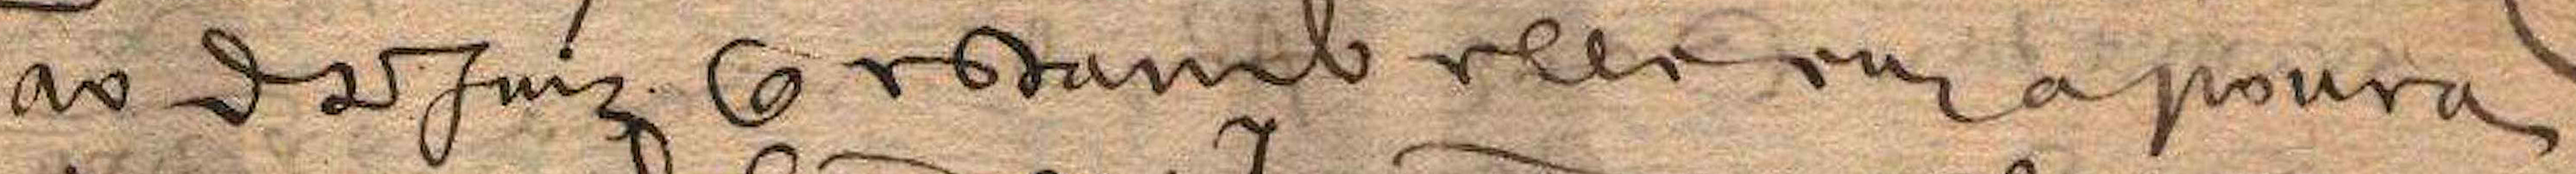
ao dto Juiz q̄ estando elle em arouca
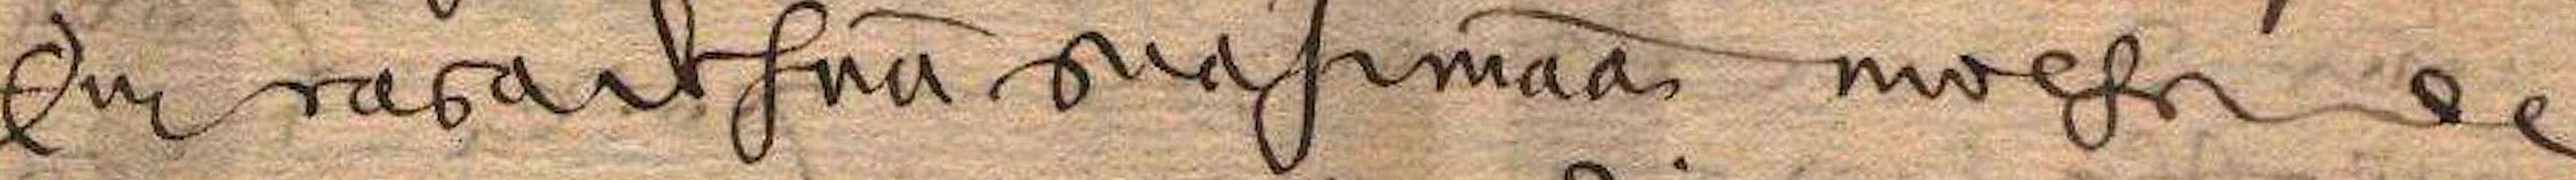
Em casa de huā sua Jrmãa molher de
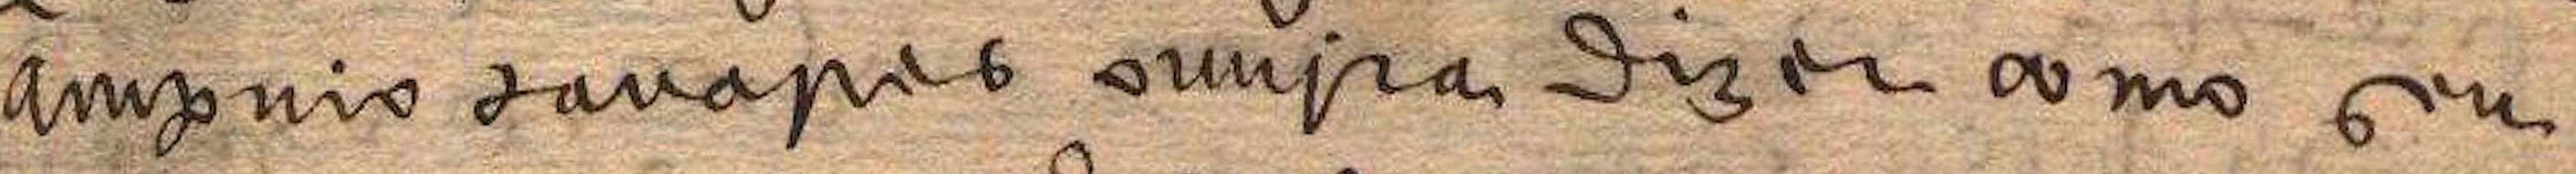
amtonio tauares ouujra dizer como seu
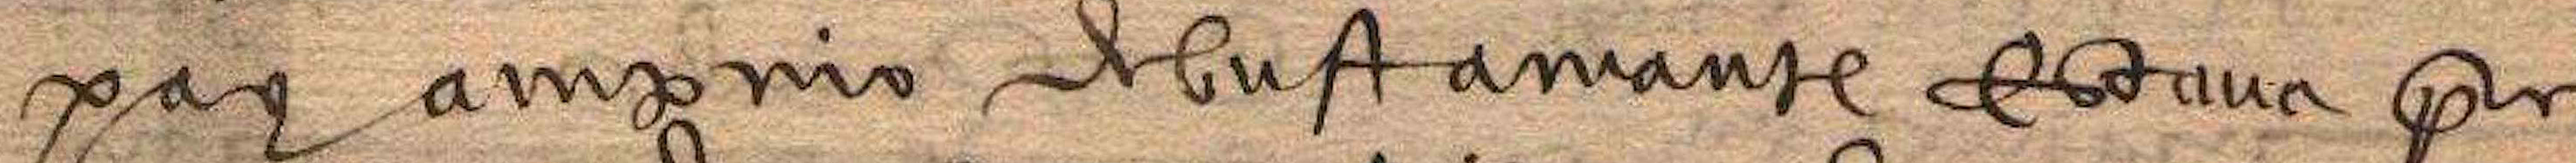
pay amtonio de bustamante Estaua pre
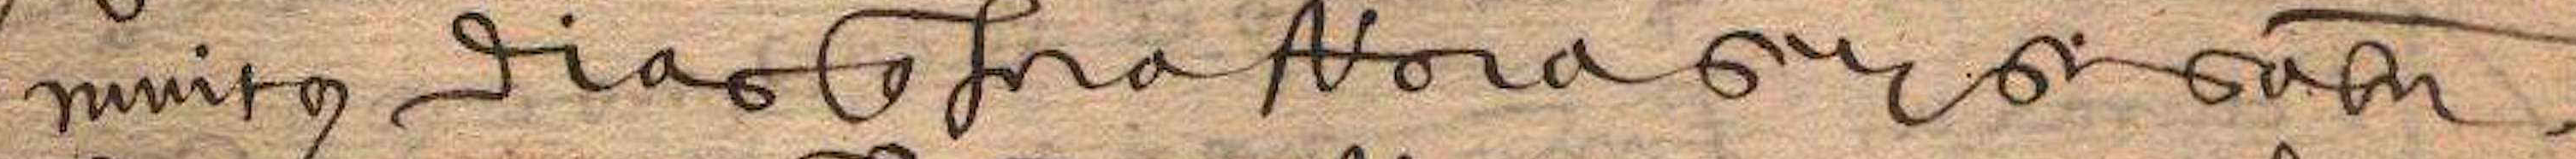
muitꝯ dias q̄ hera ffora sem se sābr
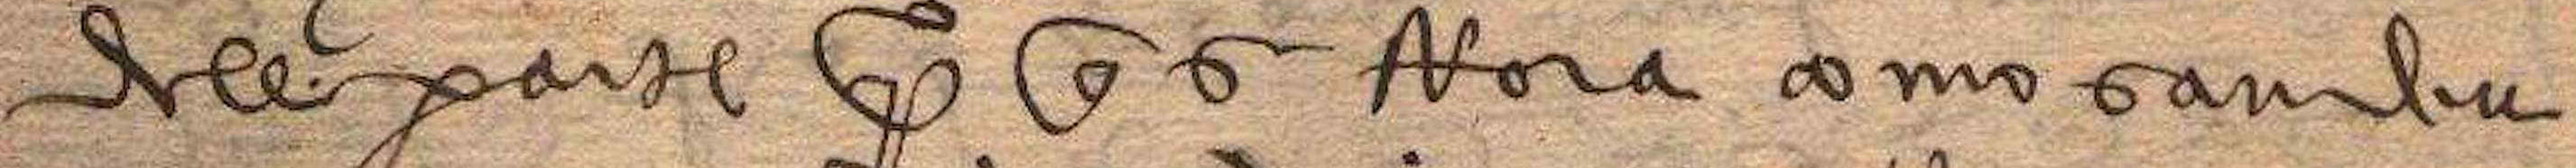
delle parte p̄oq̄ se ffora como sandeu
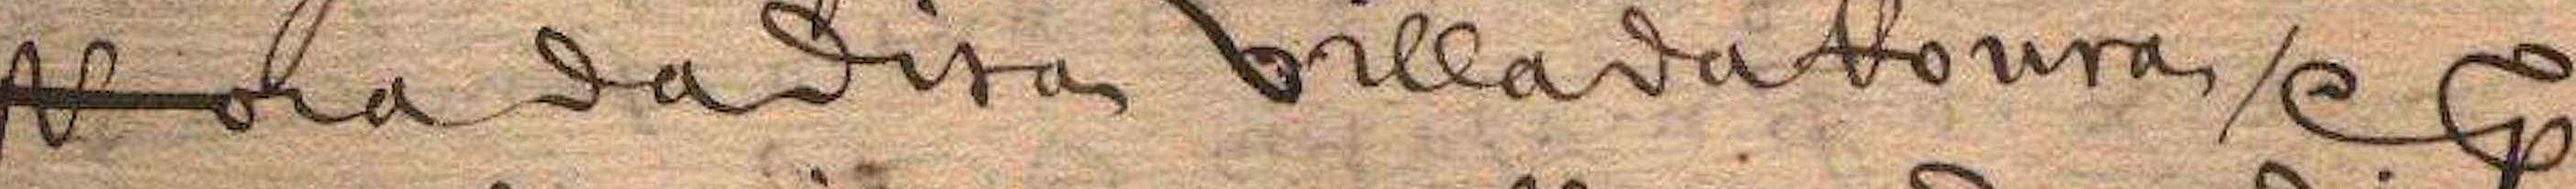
ffora da dita villa daRouca / e p̄o
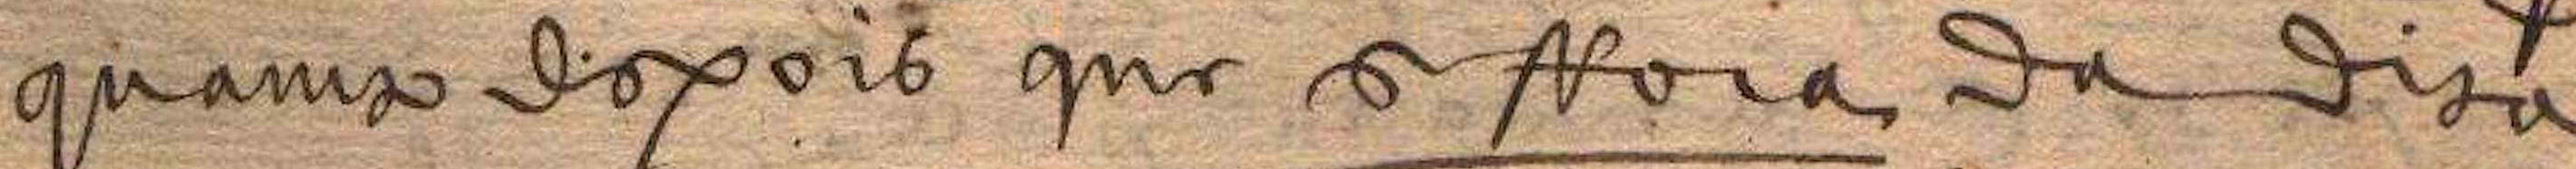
quamto despois que se ffora da dita
